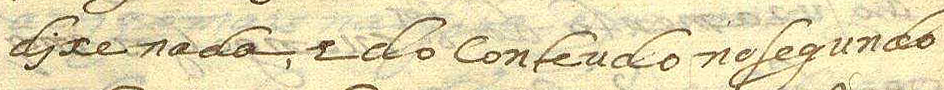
djxe nada, E do conteudo no segundo
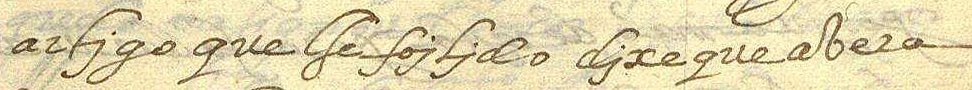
artjgo que lhe foj ljdo djxe que avera
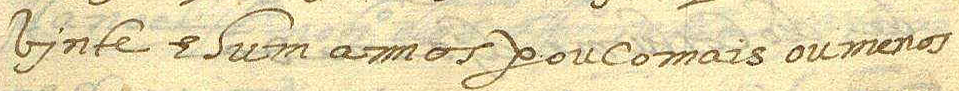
vjnte E hum annos pouco mais ou menos
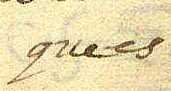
que es
